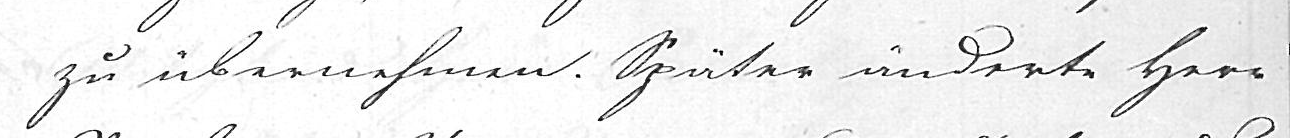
zu übernehmen. Später änderte Herr
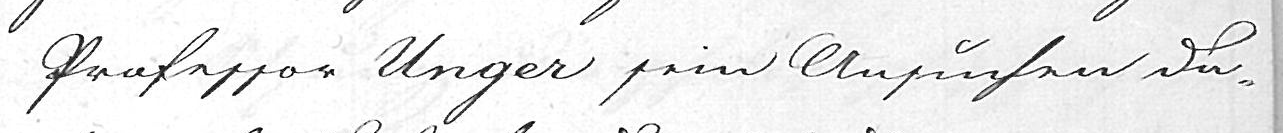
Professor Unger sein Ansuchen da-
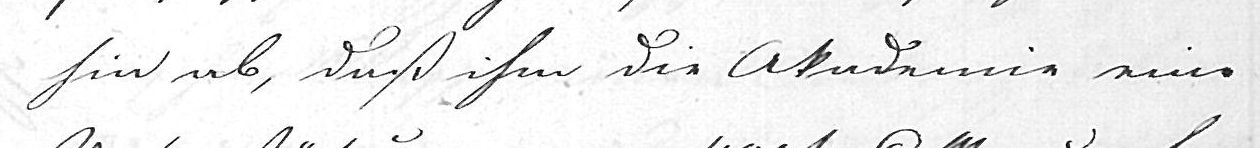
hin ab, daß ihm die Akademie eine
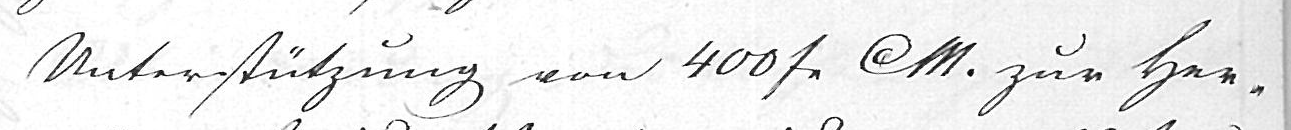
Unterstützung von 400 fl CM zur Her-
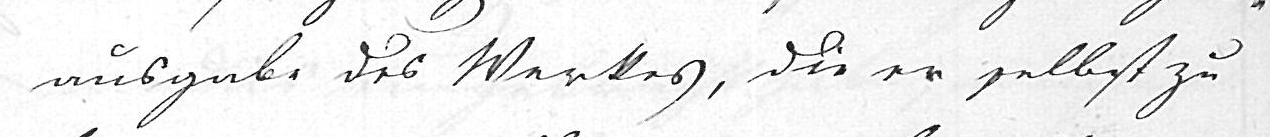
ausgabe des Werkes, die er selbst zu
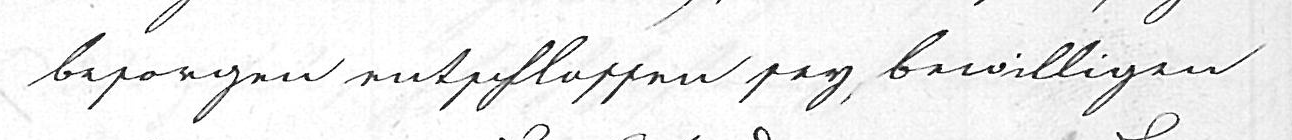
besorgen entschlossen sey, bewilligen
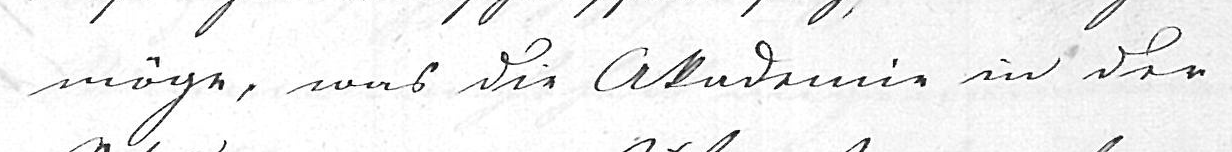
möge, was die Akademie in der
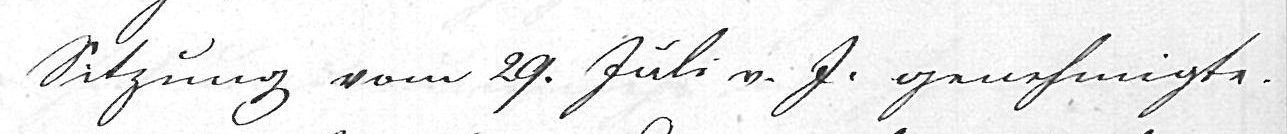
Sitzung vom 29. Juli v. J. genehmigte.
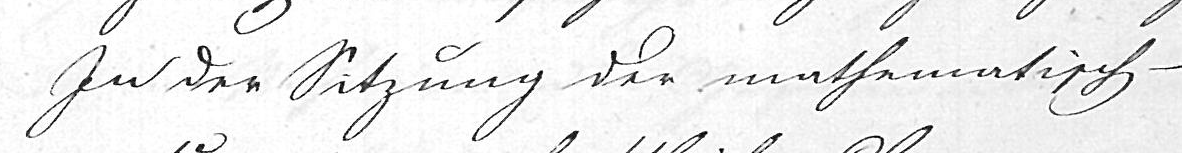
In der Sitzung der mathematisch-
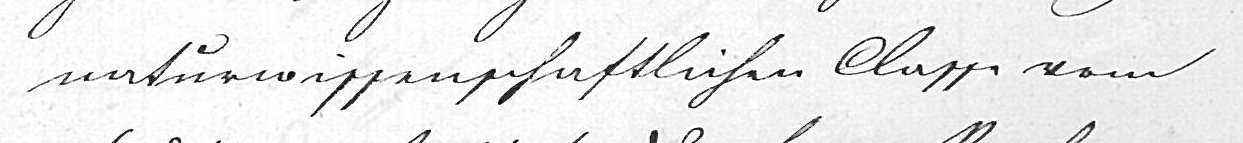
naturwissenschaftlichen Classe vom
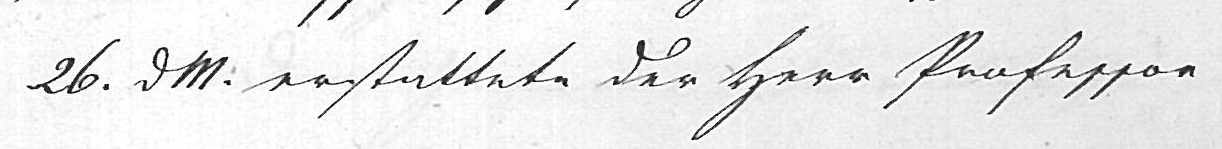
26. dM. erstattete der Herr Professor
